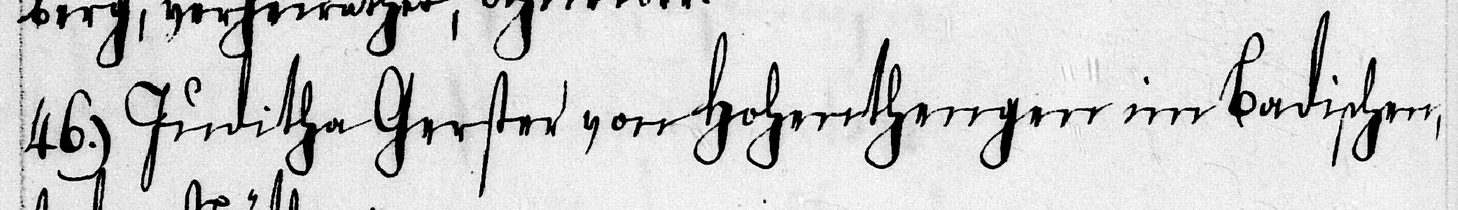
46.) Juditha Gerster von Hohenthengen im Badischen,
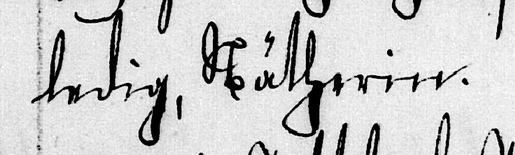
ledig, Nätherin.
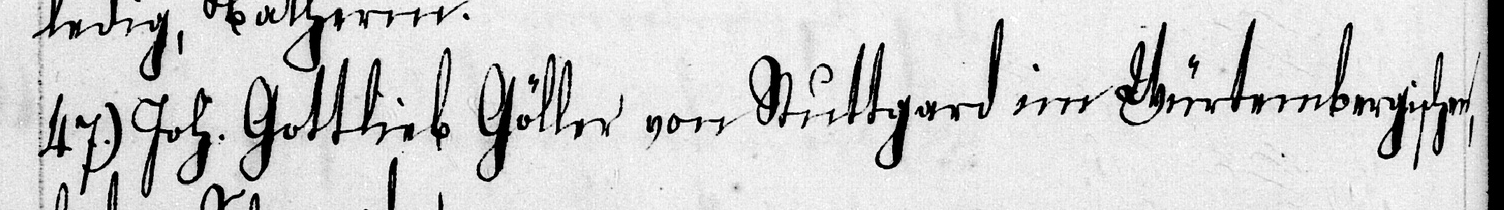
47.) Joh. Gottlieb Göller von Stuttgard im Würtemberigsch¬
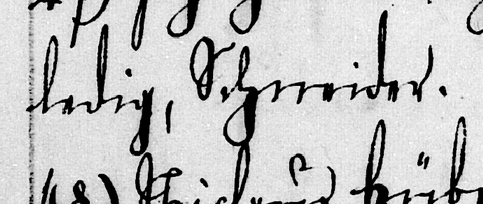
ledig, Schneider.
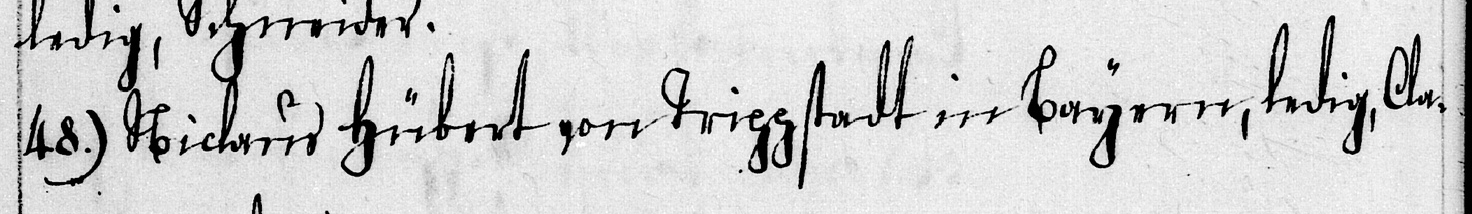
48.) Niclaus Hübert von Trippstadt in Bayern, ledig, Cl¬
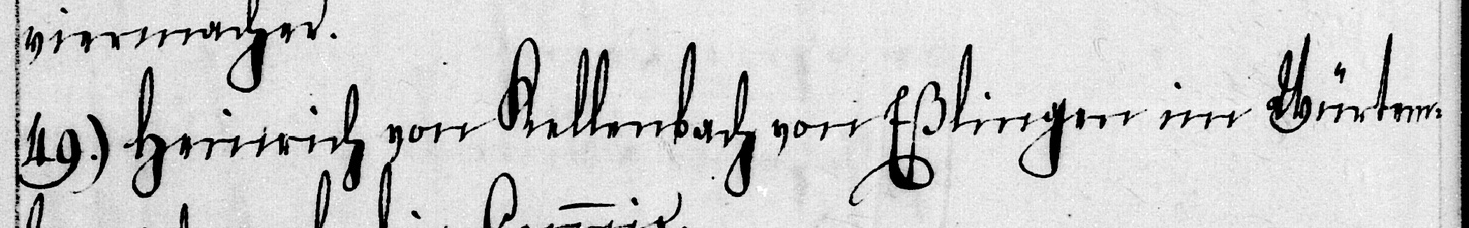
49.) Heinrich von Kellenbach von Eßlingen im Würtem¬
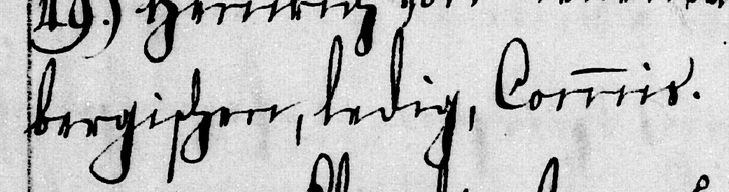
bergischen, ledig, Commis.
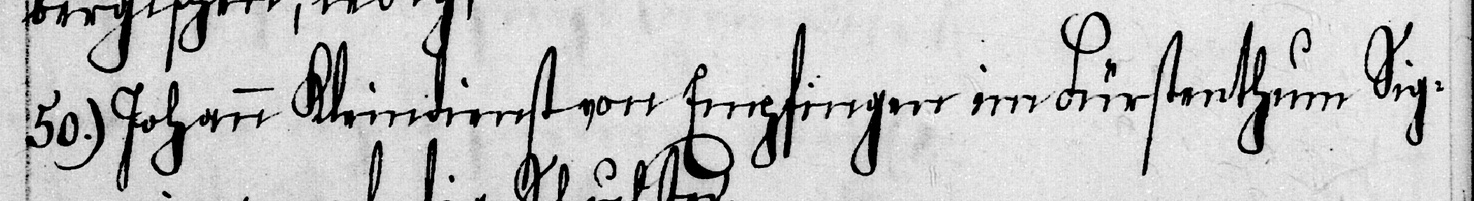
50.) Johann Kleindienst von Empfingen im Fürstenthum Sig¬
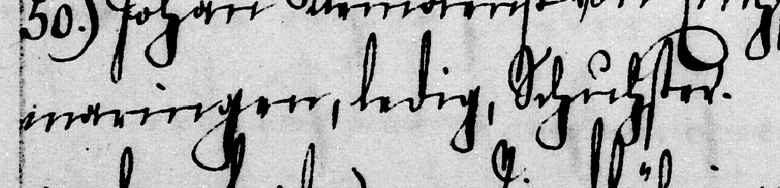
maringen, ledig, Schuhster.
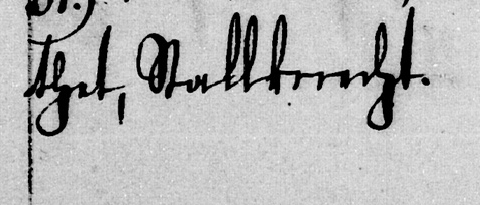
thet, Stallknecht.
